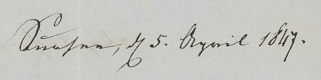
Sursee, den 5. April 1847.
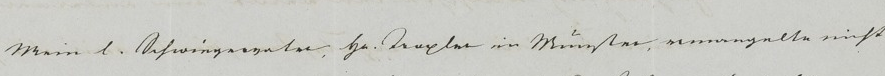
Mein l. Schwiegervater Hr. Troxler in Münster, ermangelte nicht,
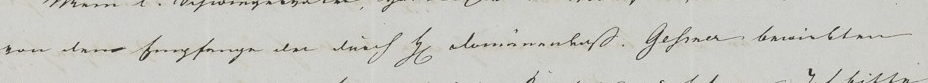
von dem Empfange der durch Herrn Domänenkaß. Gessner bewirkten
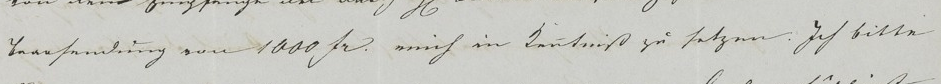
Baarsendung von 1000 fr. mich in Kenntniß zu setzen. Ich bitte
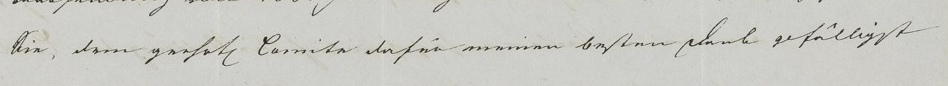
Sie, dem geehrten Comite dafür meinen besten Dank gefälligst
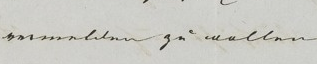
vermelden zu wollen.
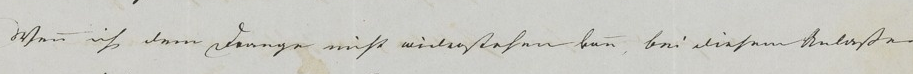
Wenn ich dem Drange nicht widerstehen kann, bei diesem Anlaße
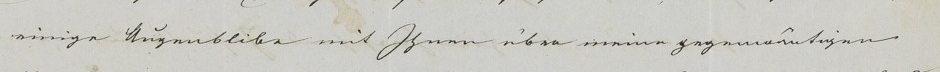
einige Augenblike mit Ihnen über meine gegenwärtigen
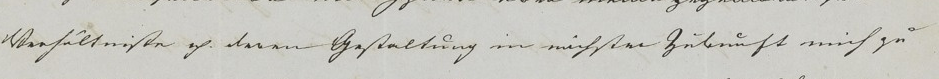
Verhältniße &. deren Gestaltung in nächster Zukunft mich zu
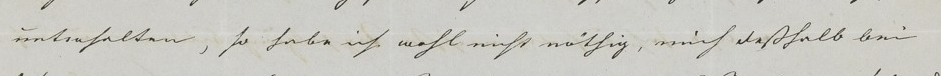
unterhalten, so habe ich wohl nicht nöthig, mich deßhalb bei
